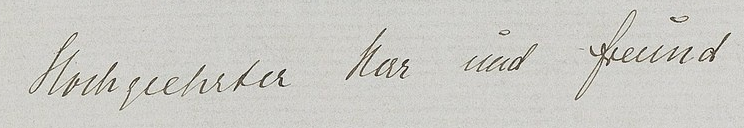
Hochgeehrter Herr und Freund
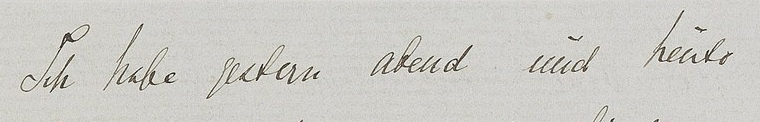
Ich habe gestern Abend und heute
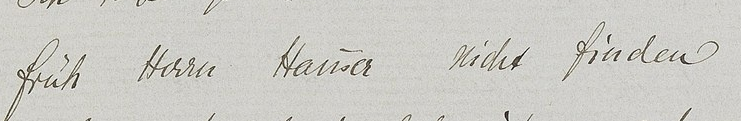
früh Herrn Hammer nicht finden
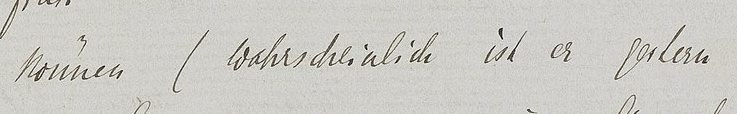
können (wahrscheinlich ist er gestern
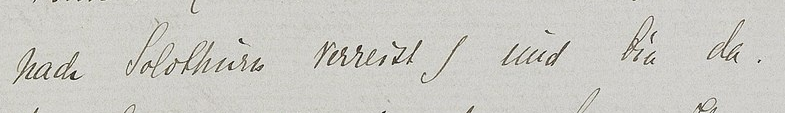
nach Solothurn verreist) und bin da-
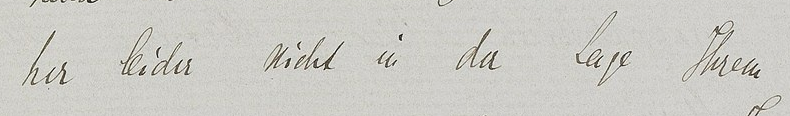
her leider nicht in der Lage Ihrem
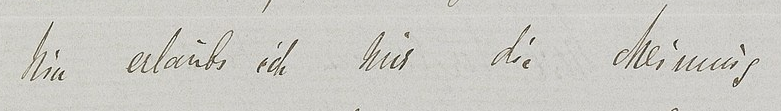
hin erlaube ich mir die Meinung
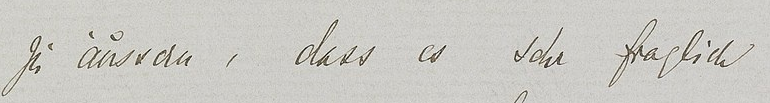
zu äussern, dass es sehr fraglich
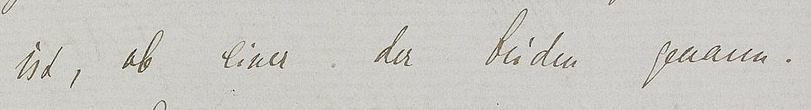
ist, ob einer der beiden genann-
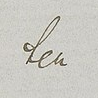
ten
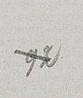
Wahl
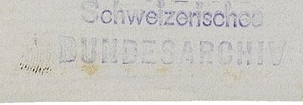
annehmen
